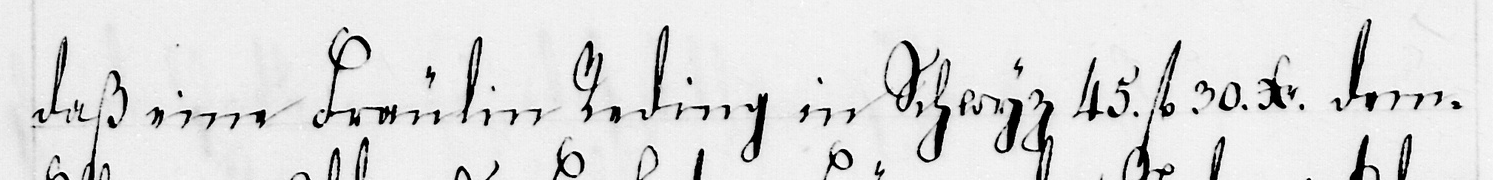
daß eine Fräulin Reding in Schwyz 45. fl. 30. Xr. dem¬
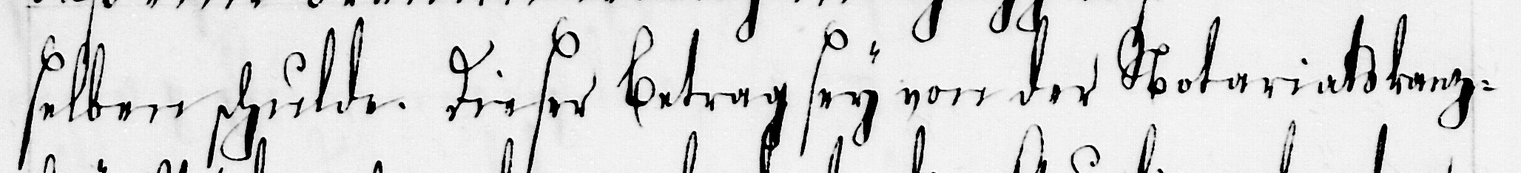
selben schulde. Dieser Betrag sey von der Notariatskanz¬
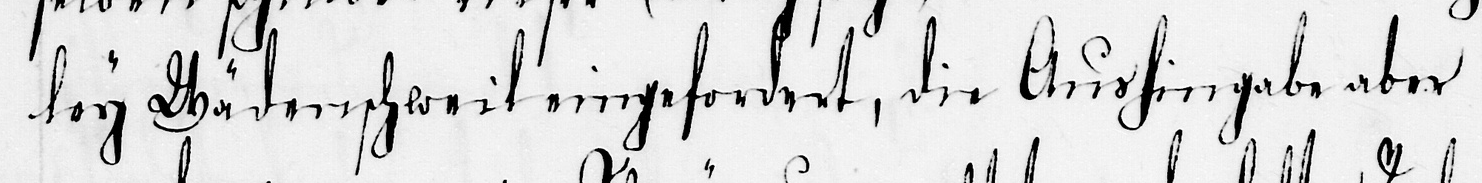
ley Wädenschweil eingefordert, die Aushingabe aber
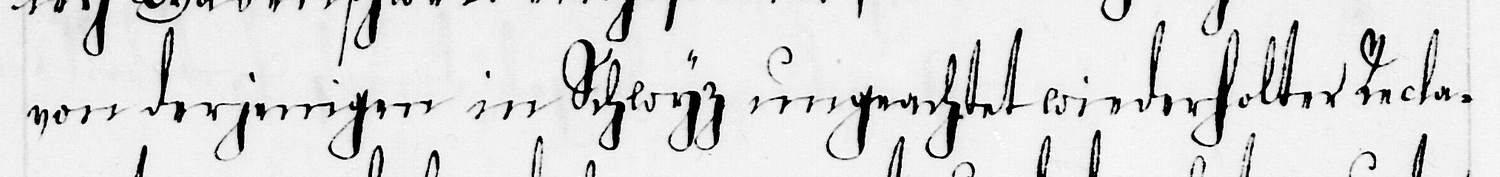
von derjenigen in Schwyz ungeachtet wiederholter Recla¬
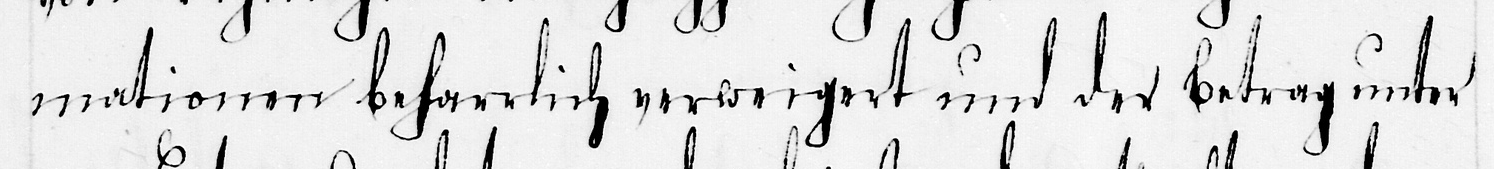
mationen beharrlich verweigert und der Betrag unter
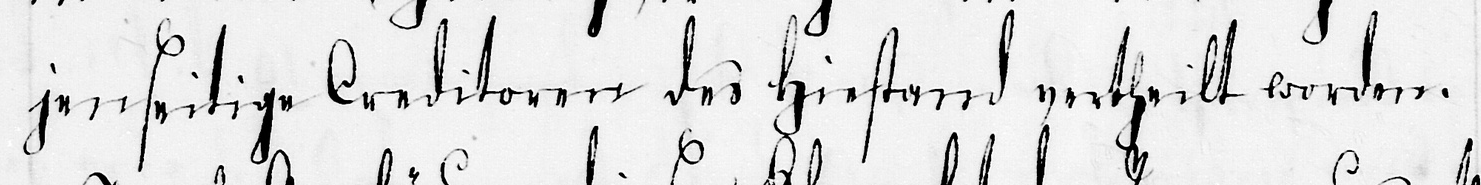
jenseitige Creditoren des Hiestand vertheilt worden.
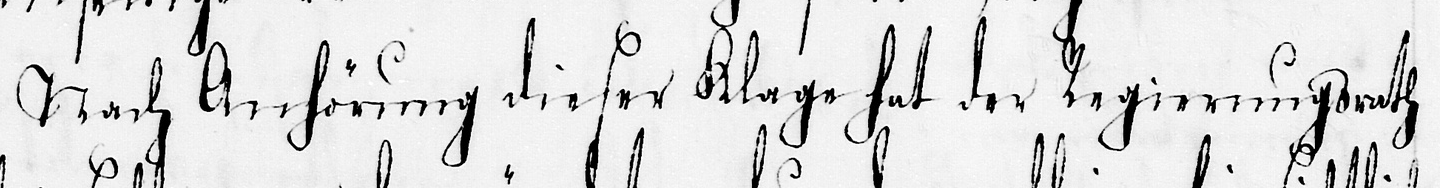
Nach Anhörung dieser Klage hat der Regierungsrath
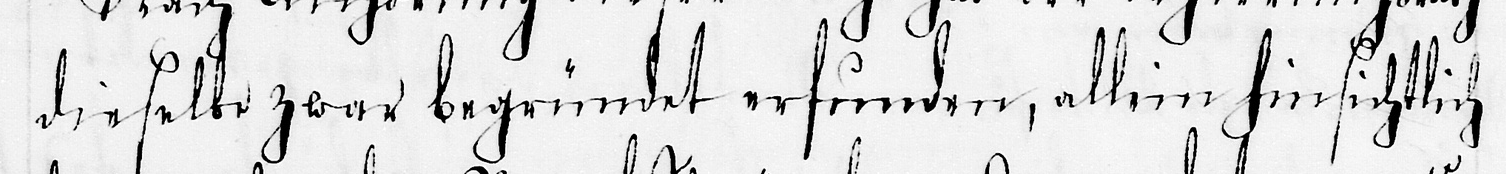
dieselbe zwar begründet erfunden, allein hinsichtlich
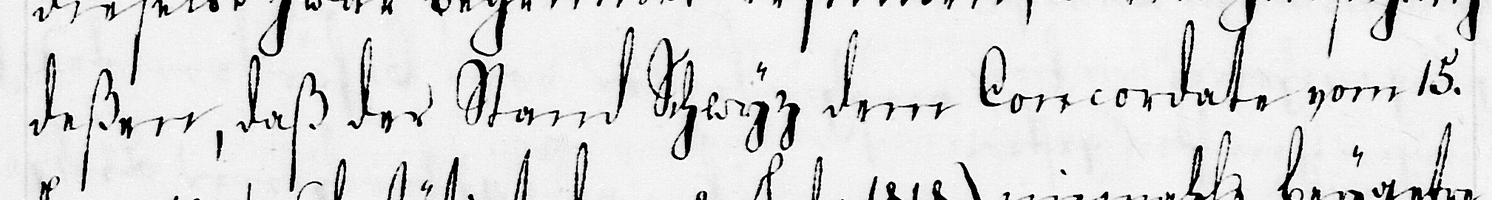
deßen, daß der Stand Schwyz dem Concordate vom 15.
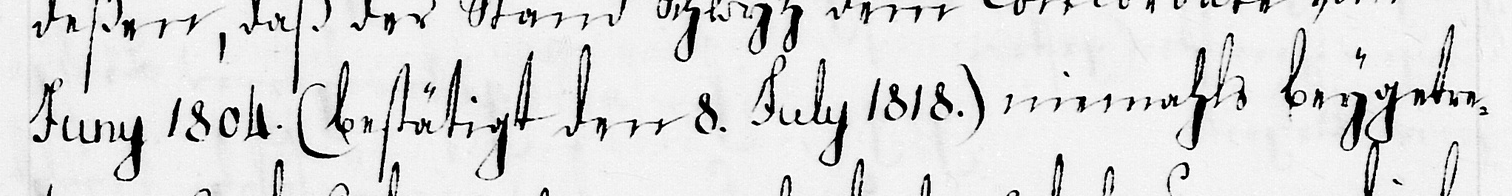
Juny 1804. (bestätigt den 8. July 1818.) niemahls beygetre¬
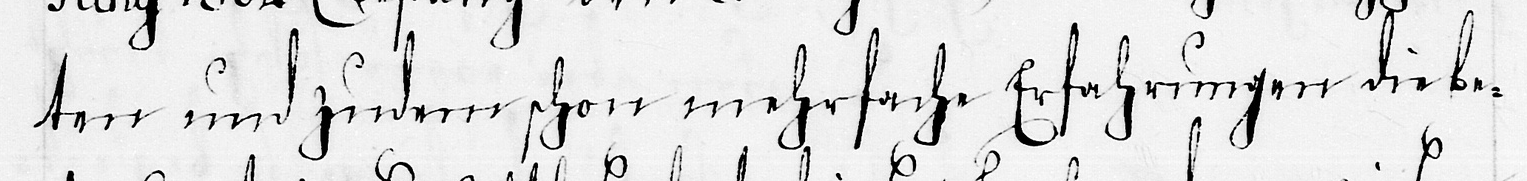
ten und zudem schon mehrfache Erfahrungen die be¬
